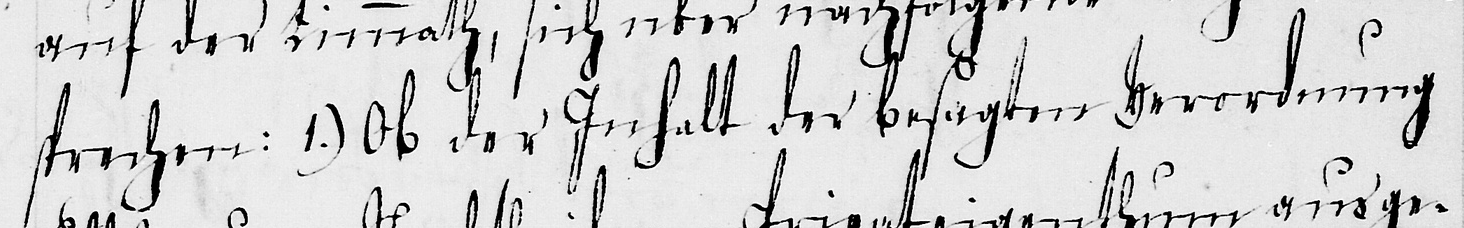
sprechen: 1.) Ob der Inhalt der besagten Verordnung
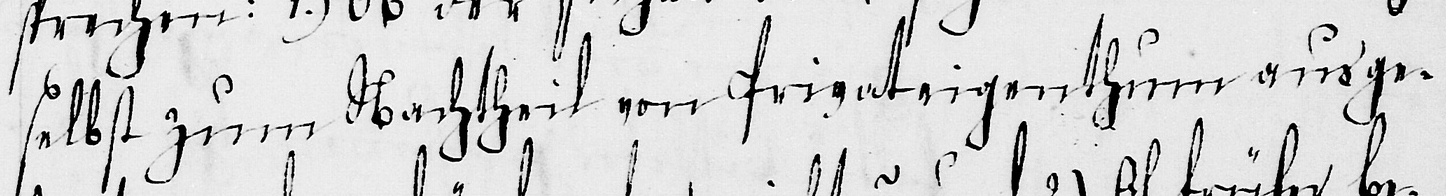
selbst zum Nachtheil von Privateigenthum ausge¬
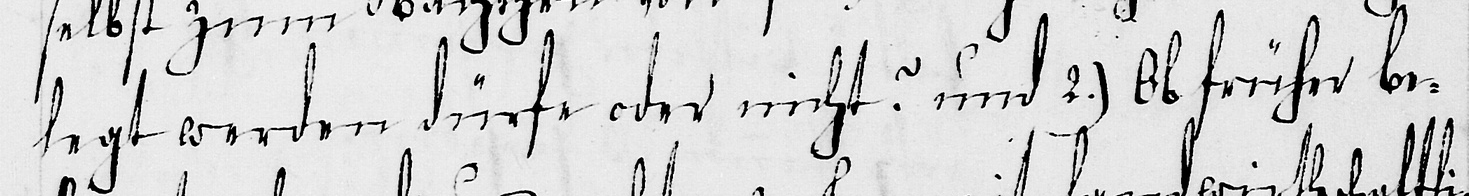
legt werden dürfe oder nicht? und 2.) Ob früher be¬
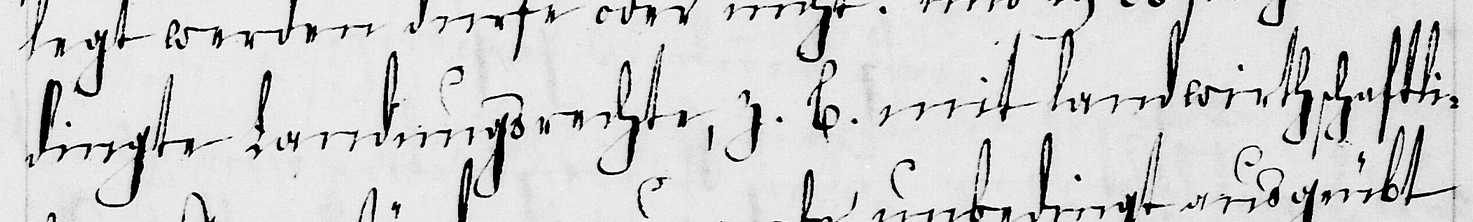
dingte Landungsrechte, z. B. mit landwirtschaftl¬
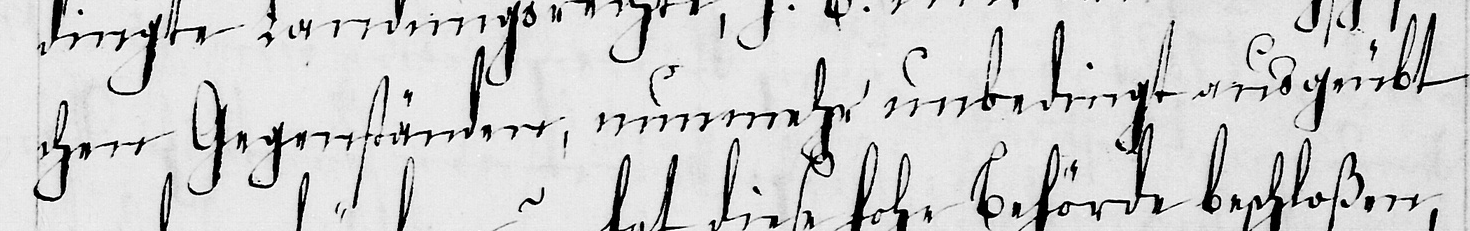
ichen Gegenständen, nunmehr unbedingt ausgeübt
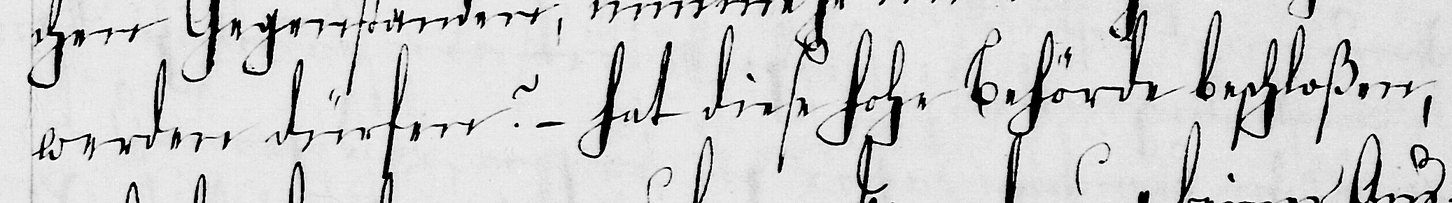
werden dürfen? – hat diese Hohe Behörde beschloßen,
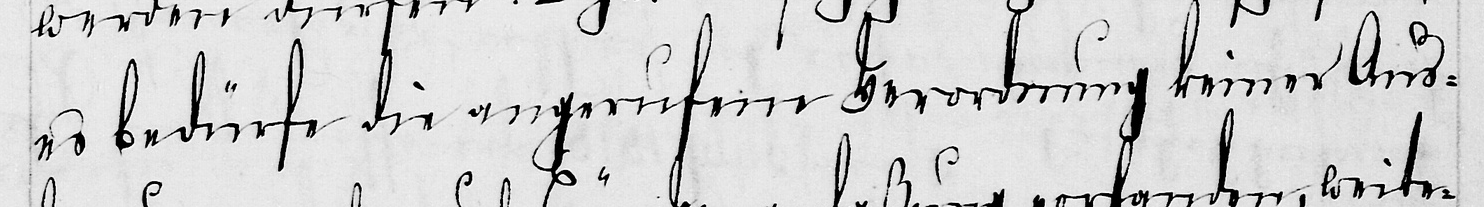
es bedürfe die angerufene Verordnung keiner Aus¬
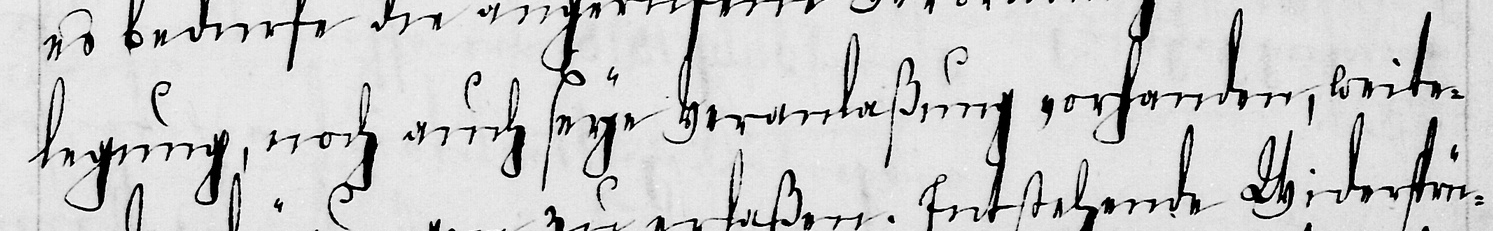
legung, noch auch seye Veranlaßung vorhanden, weite¬
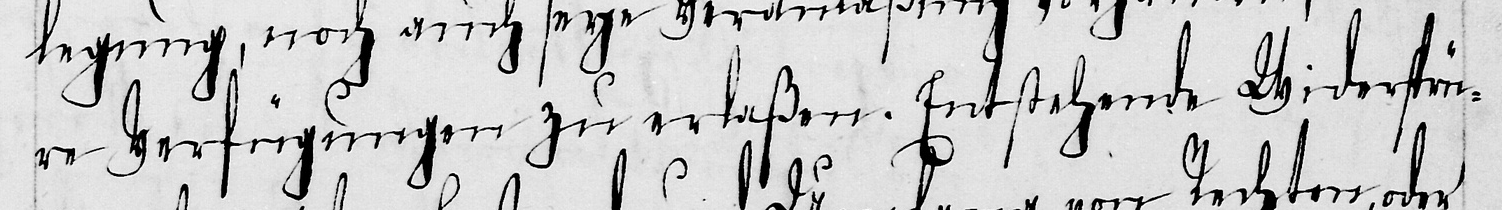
re Verfügungen zu erlaßen. Entstehende Widersprü¬
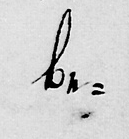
der
